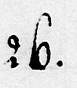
26.
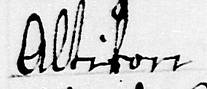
Altikon
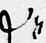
24.
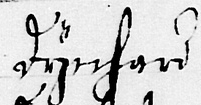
Dynhard
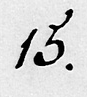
15.
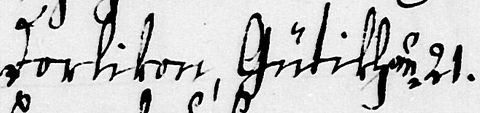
Dorlikon, Gütikhau¬
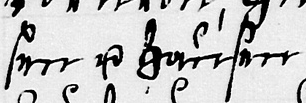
sen u. Hausen
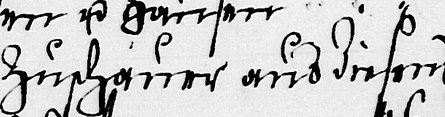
Zuschauer aus diesen
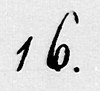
16.
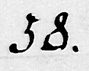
35.
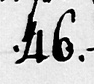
40.
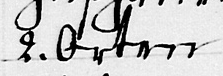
2. Orten
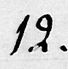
12.
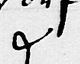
5.
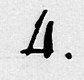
4.
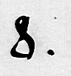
3.
